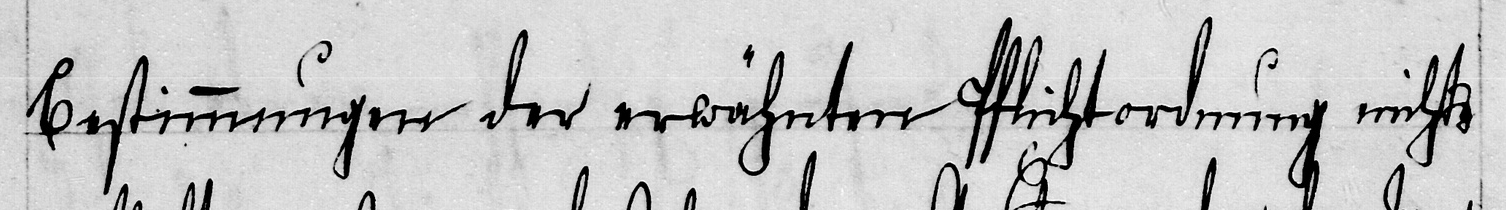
Bestimmungen der erwähnten Pflichtordnung nichts
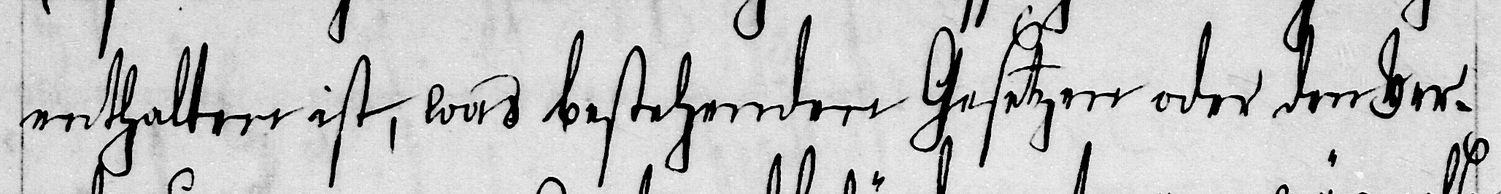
enthalten ist, was bestehenden Gesetzen oder den Ver¬
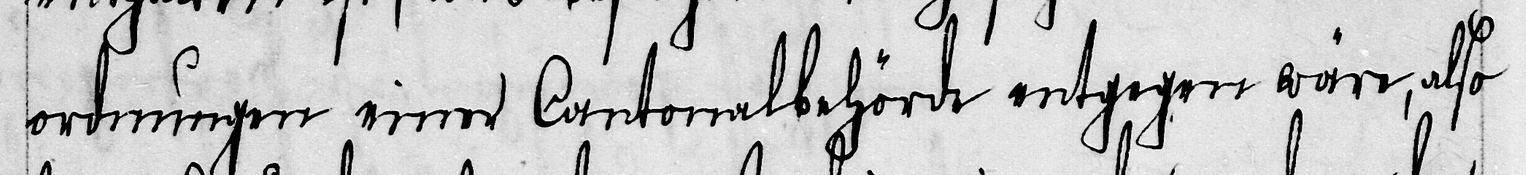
ordnungen einer Cantonalbehörde entgegen wäre, also
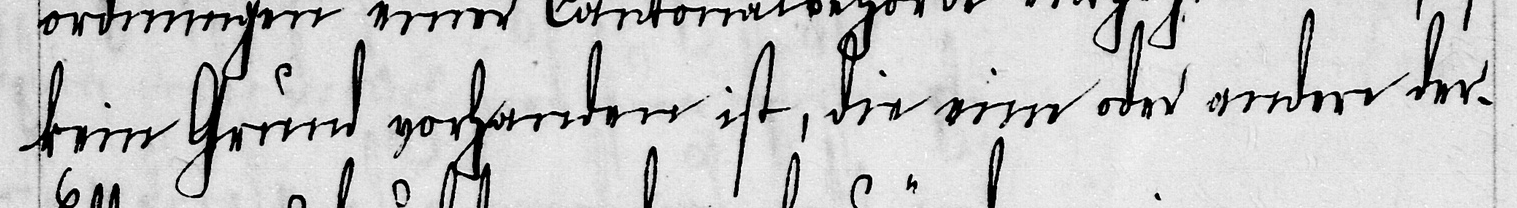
kein Grund vorhanden ist, die eine oder andere der¬
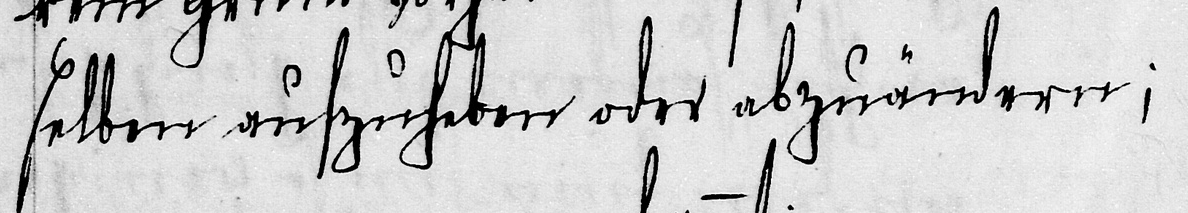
selben aufzuheben oder abzuändern;
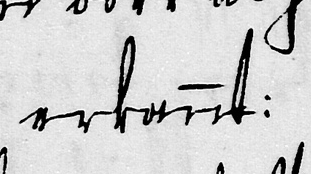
erkannt:
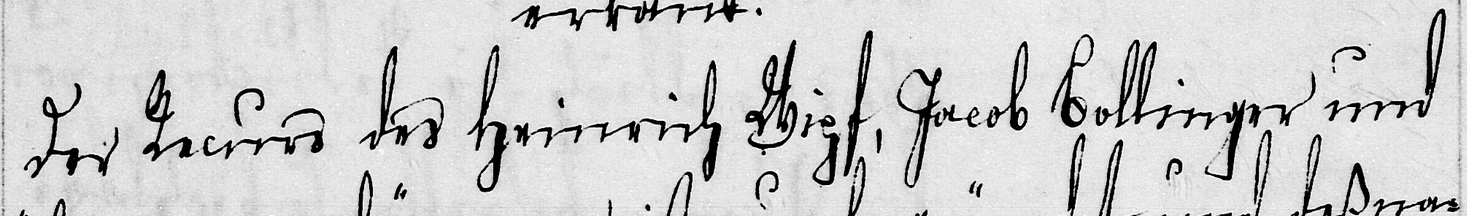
Der Recurs des Heinrich Wipf, Jacob Bollinger und
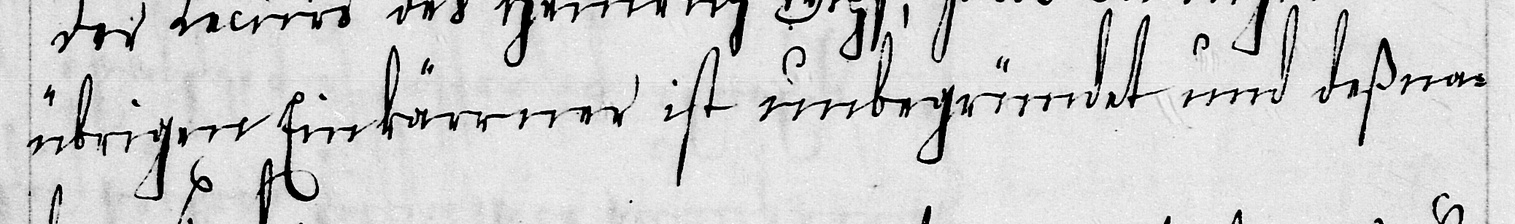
übrigen Einkärrner ist unbegründet und deßna¬
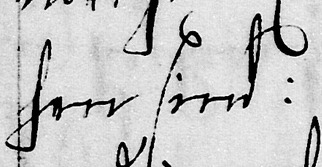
hen sind:
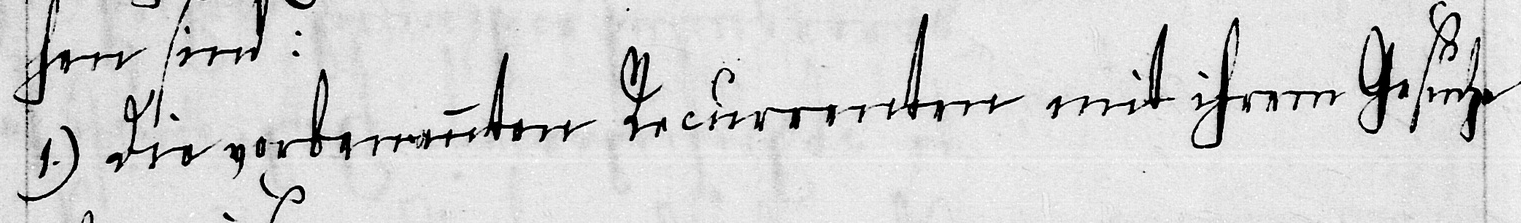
1.) Die vorbenannten Recurrenten mit ihrem Gesuche
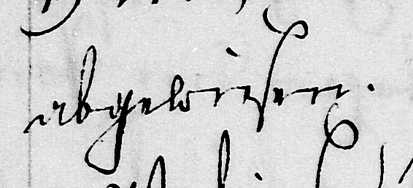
abgewiesen.
